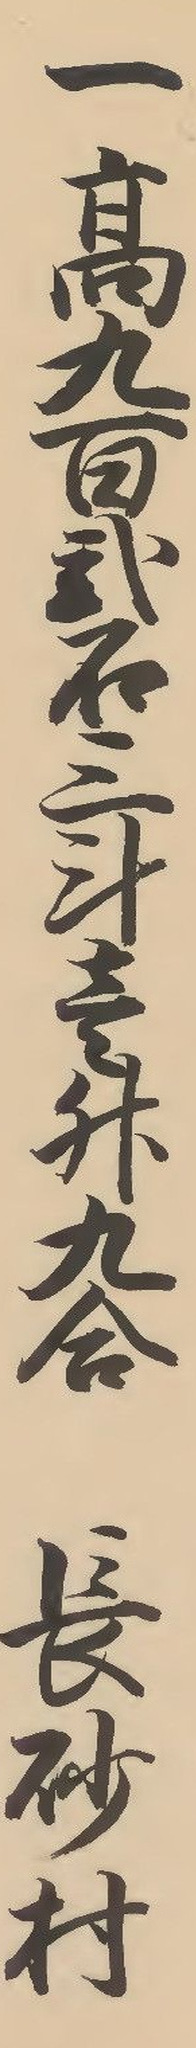一髙九百弐石三斗壱升九合長砂村
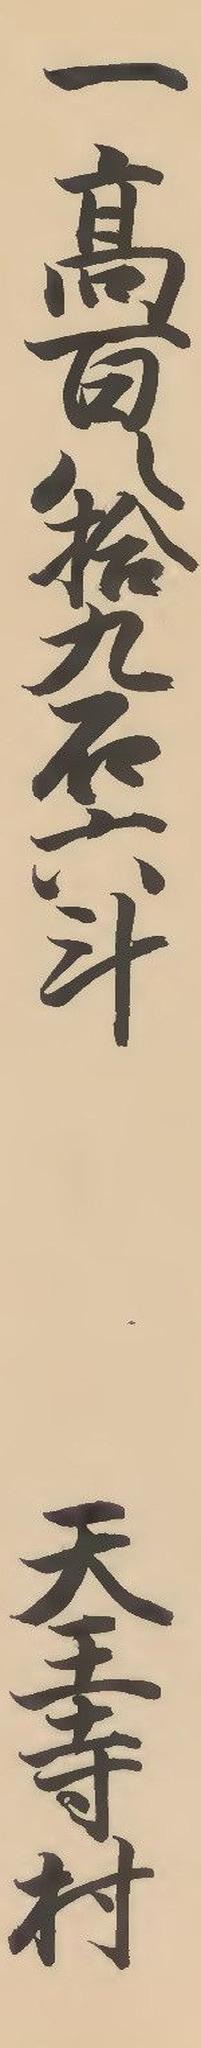一髙百八拾九石六斗天王寺村
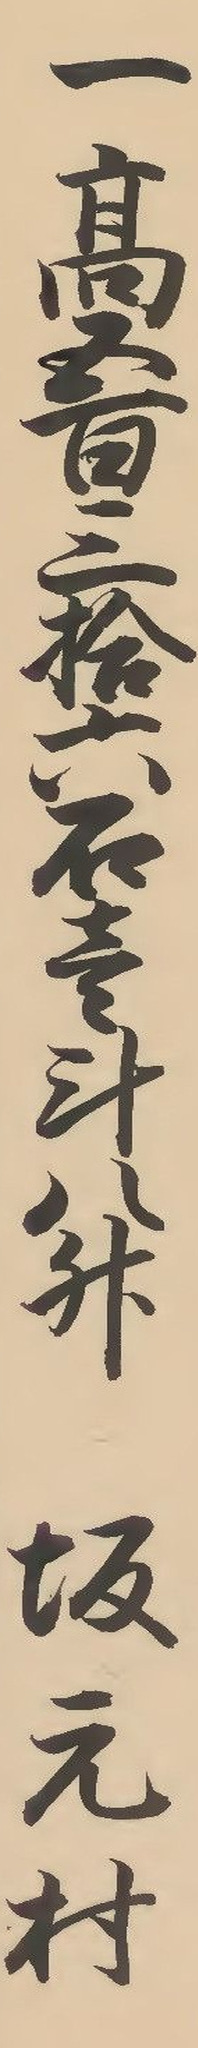一髙五百三拾六石壱斗八升坂元村
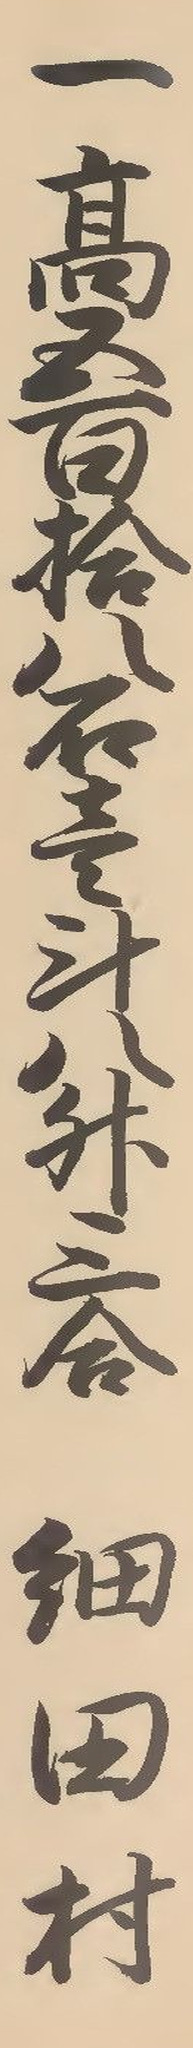一髙五百拾八石壱斗八升三合細田村
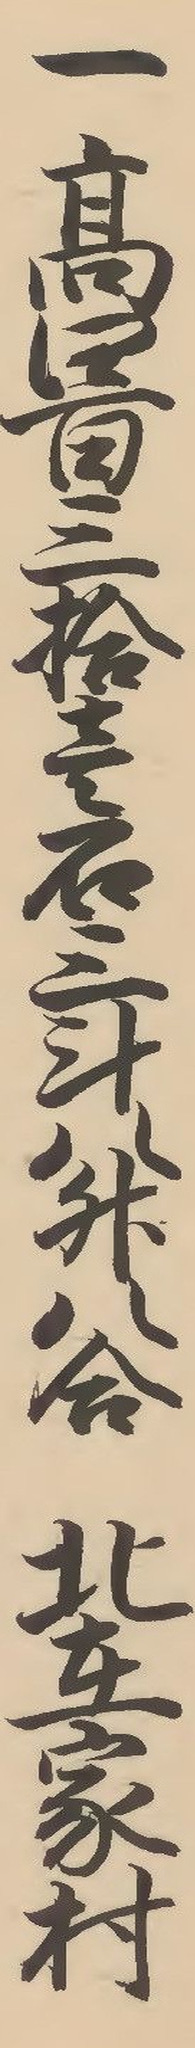一髙四百三拾壱石三斗八升八合北在家村
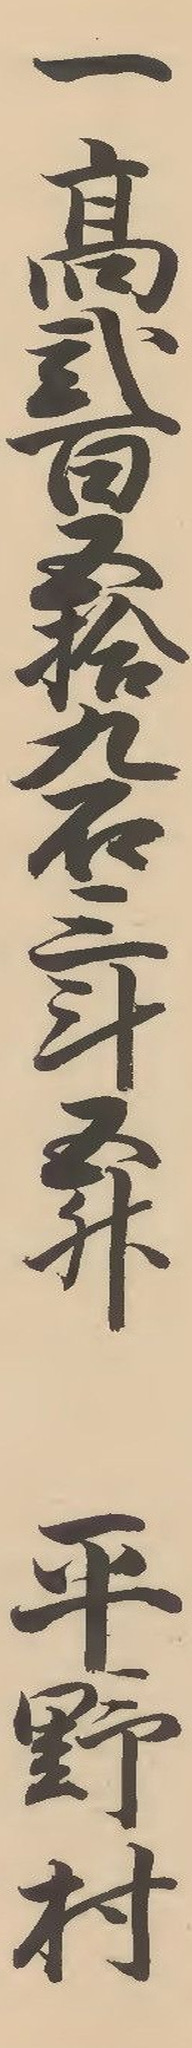一髙弐百五拾九石三斗五升平野村
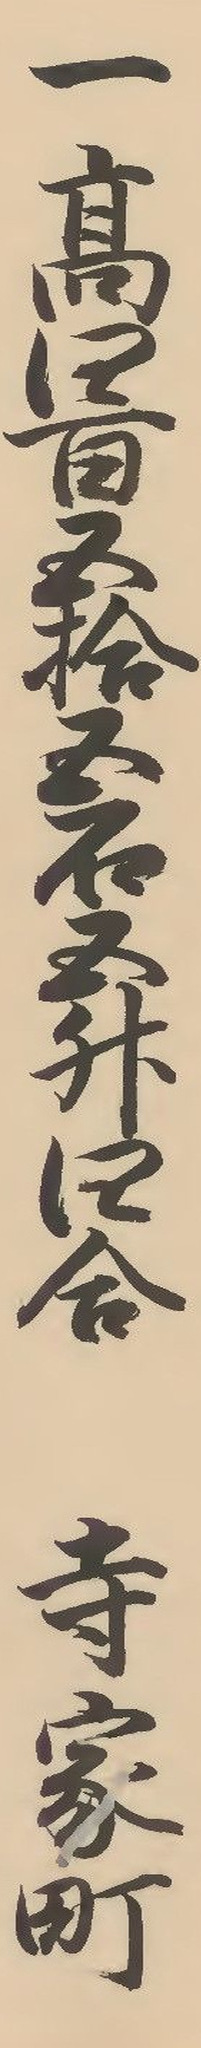一髙四百五拾五石五升四合寺家村

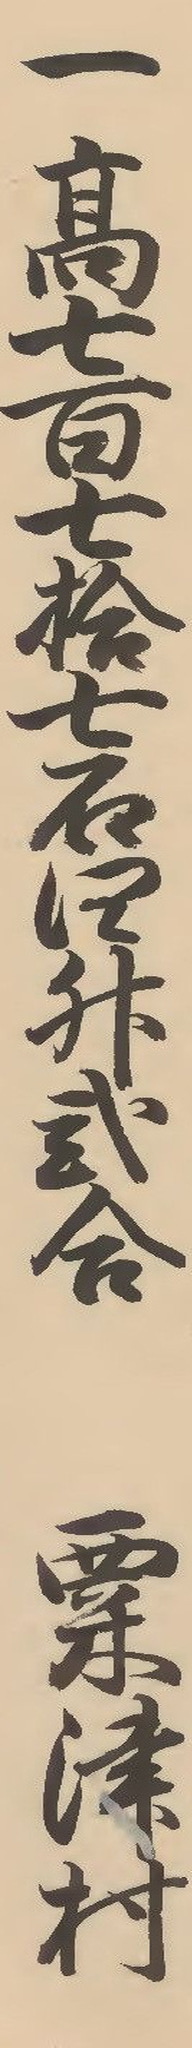一髙七百七拾七石四升弐合粟津村
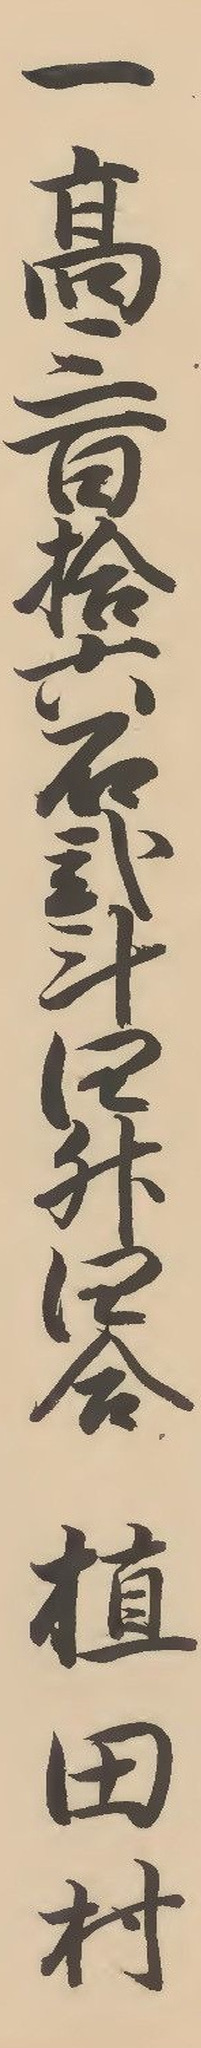一髙三百拾六石弐斗四升四合植田村
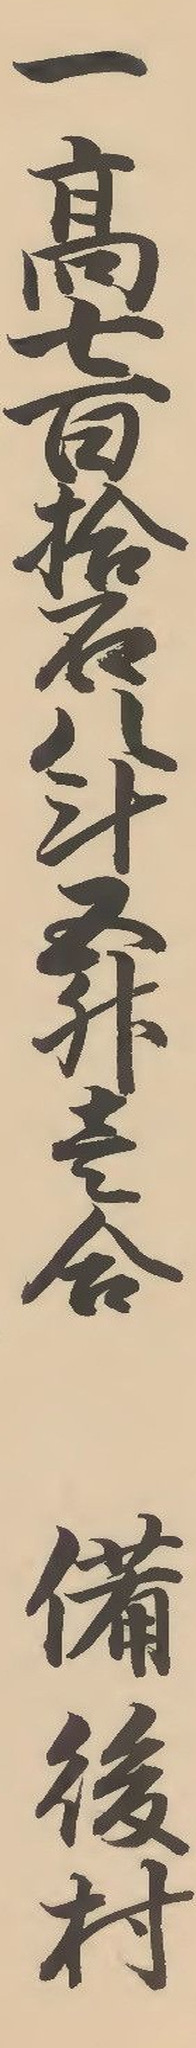一髙七百拾石八斗五升壱合備後村
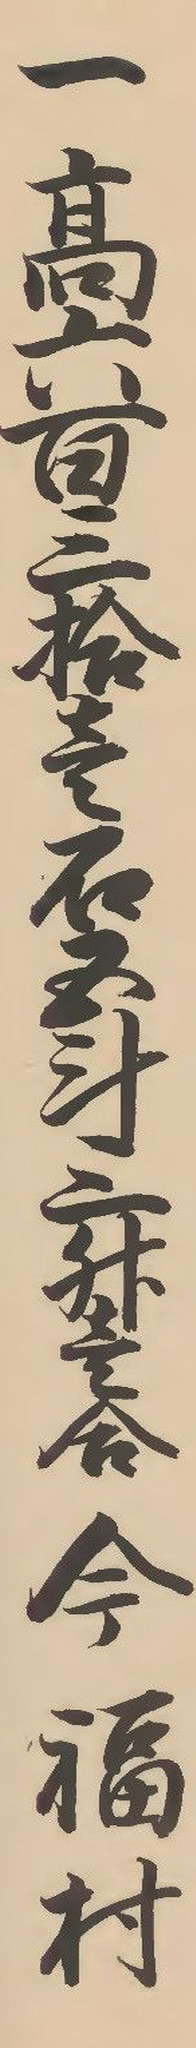一髙六百三拾壱石五斗三升壱合今福村
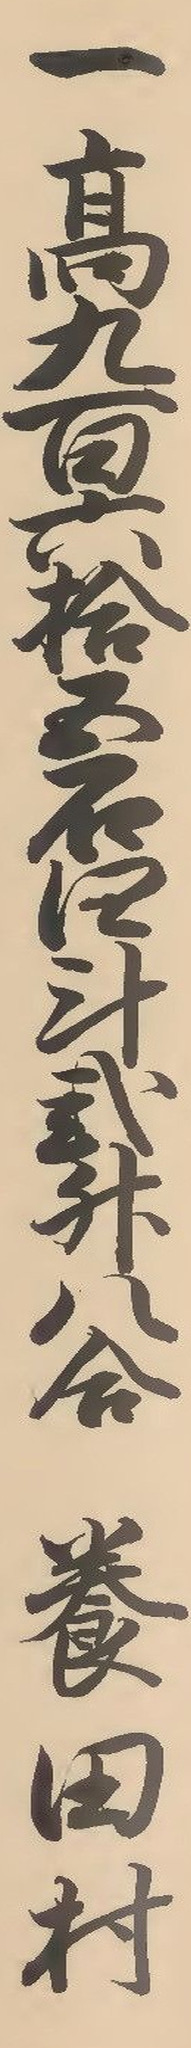一髙九百六拾五石四斗弐升八合養田村
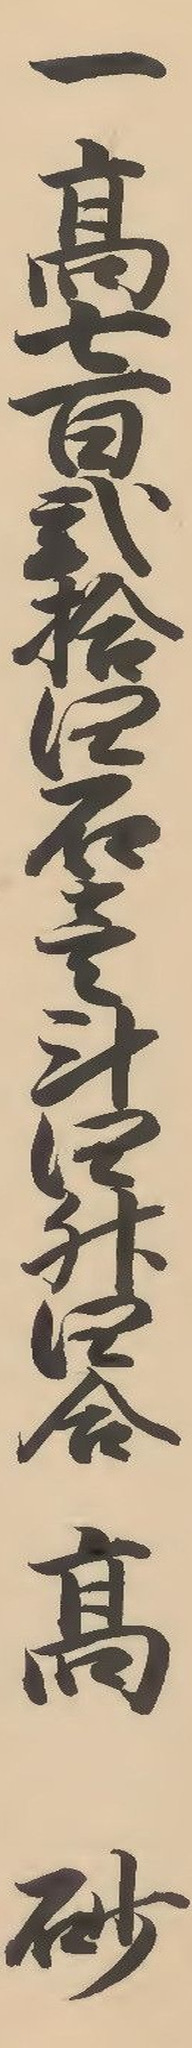一髙七百弐拾四石壱斗四升四合髙砂
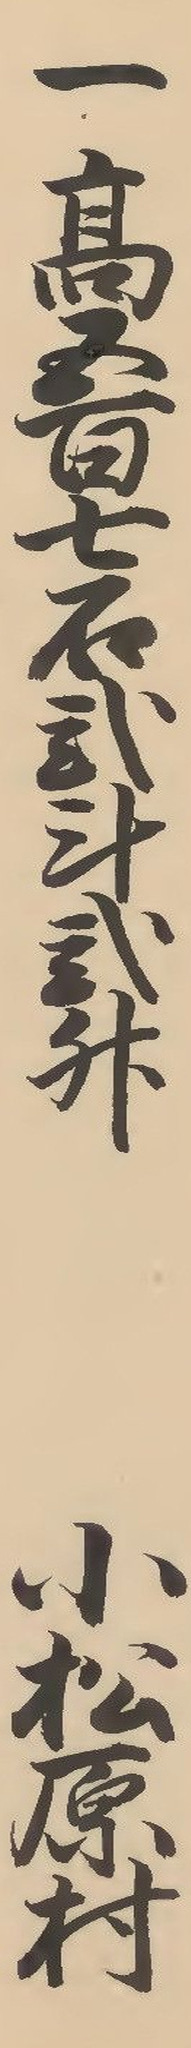一髙五百七石弐斗弐升小松原村
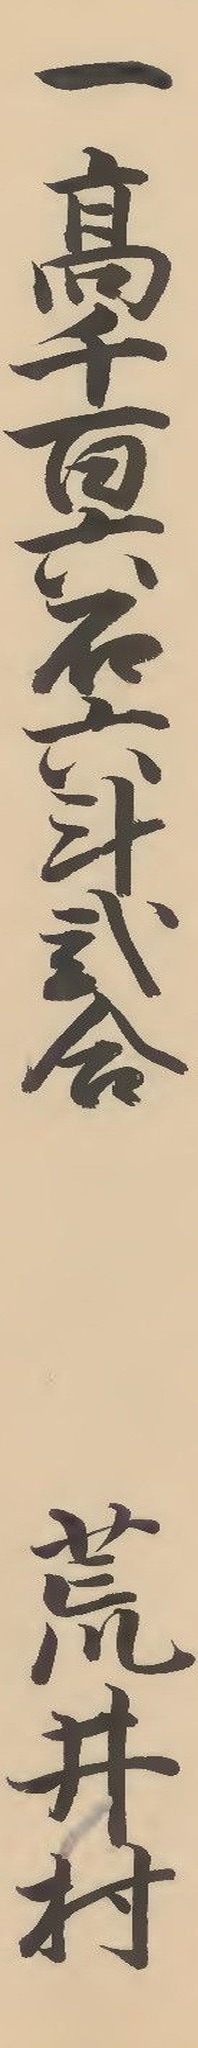一髙千百六石六斗弐合荒井村

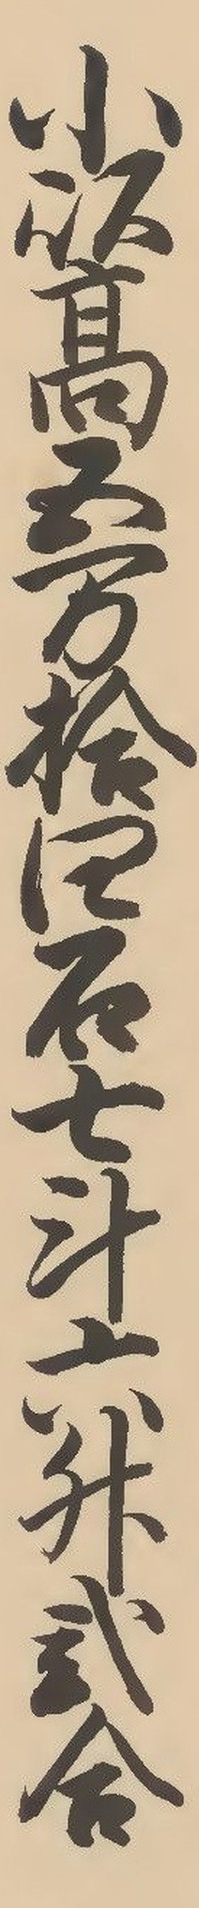小以髙五万拾四石七斗六升弐合
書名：播磨国郷帳
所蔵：国立公文書館 National Archives of Japan
